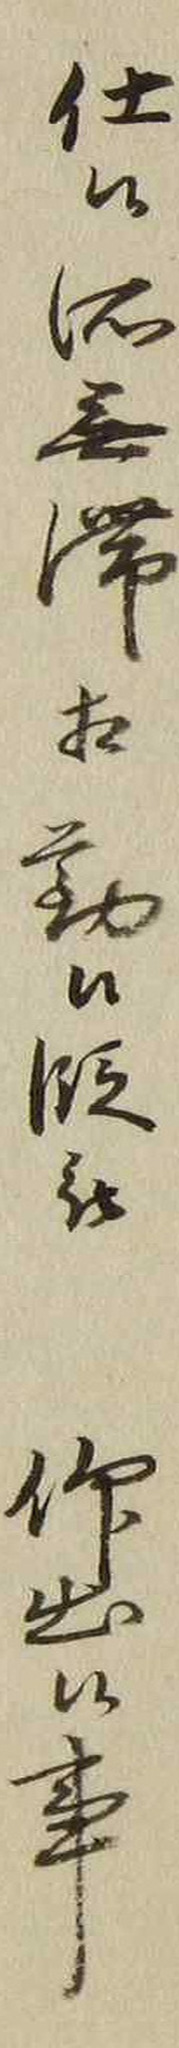仕候所無滞相勤候段被仰出候事
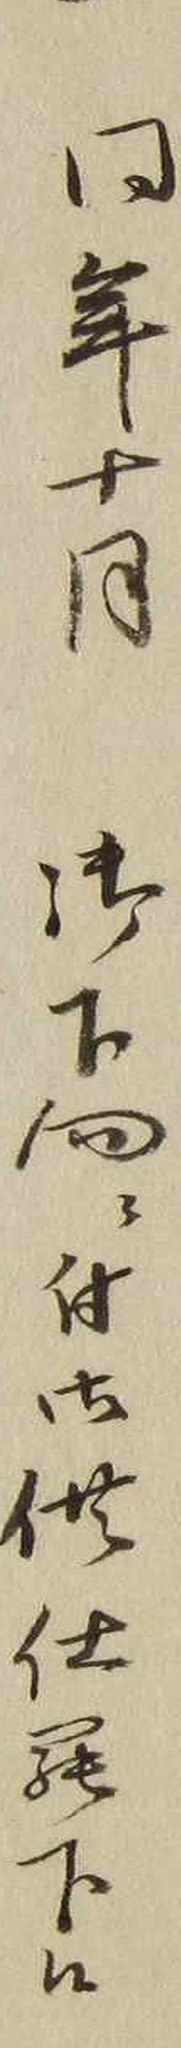一同年十月御下向ニ付御供仕罷下候

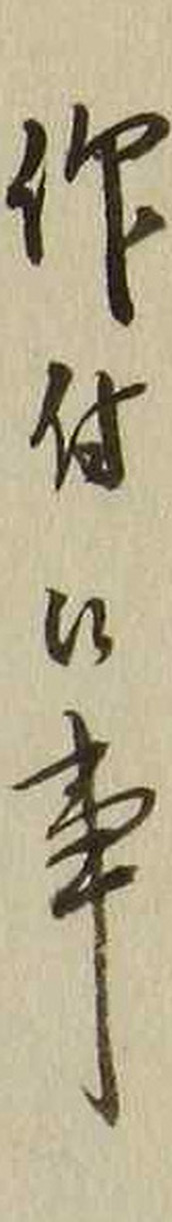仰付候事
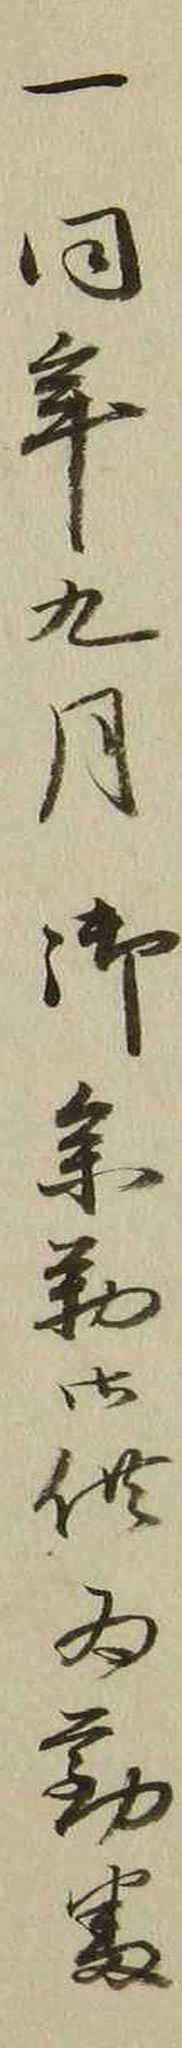一同年九月御参勤御供為勤番
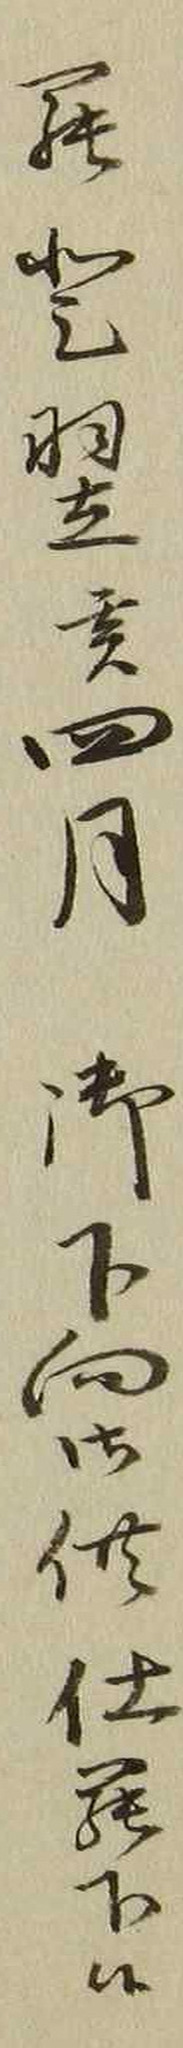罷登翌亥四月御下向御供仕罷下候
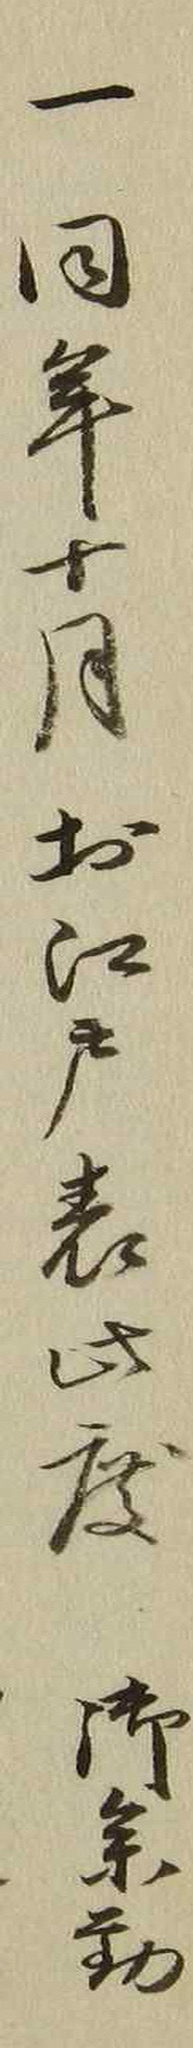一同年十月於江戸表此度御参勤
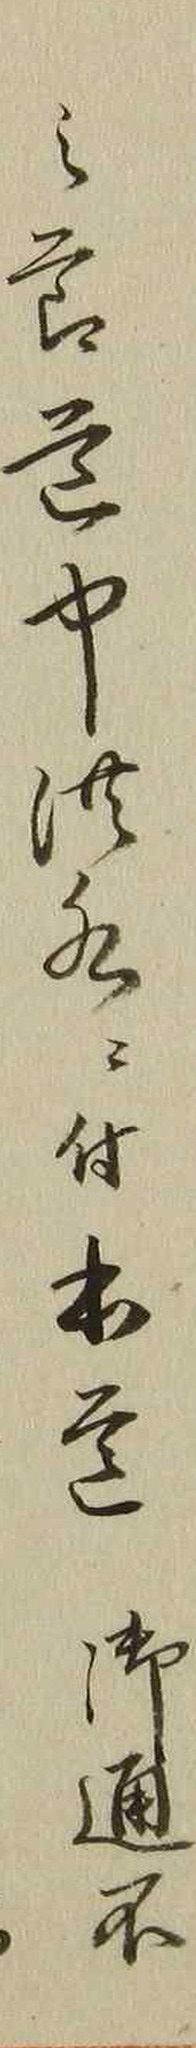之節道中洪水ニ付本道御通不
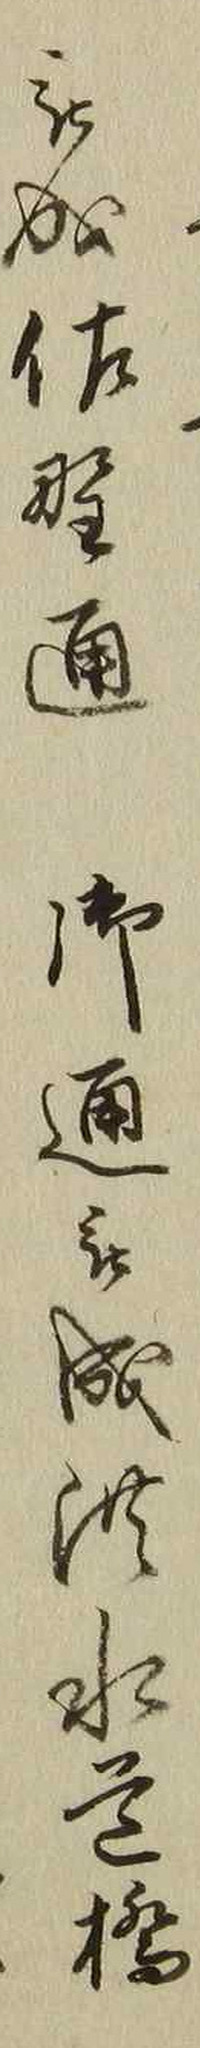被成佐野通御通被成洪水道橋
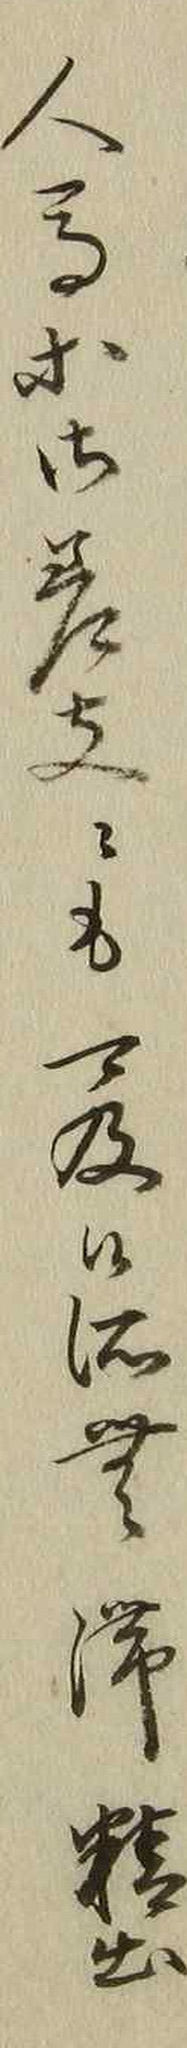人馬等御差支ニも可及候所無滞精出
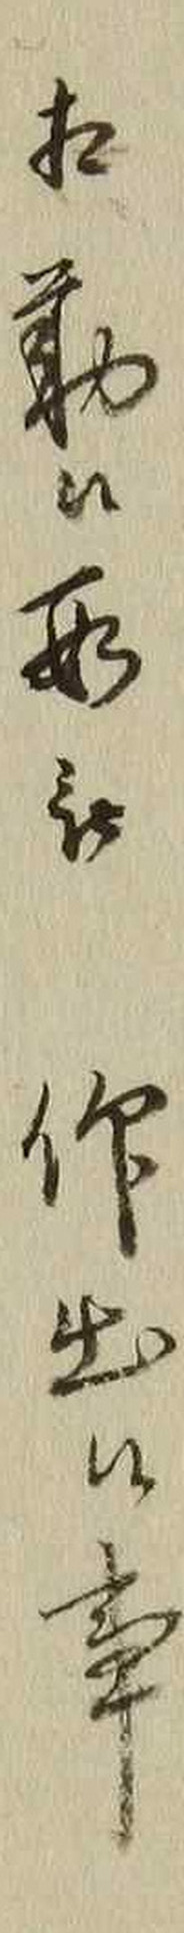相勤候段被仰出候事
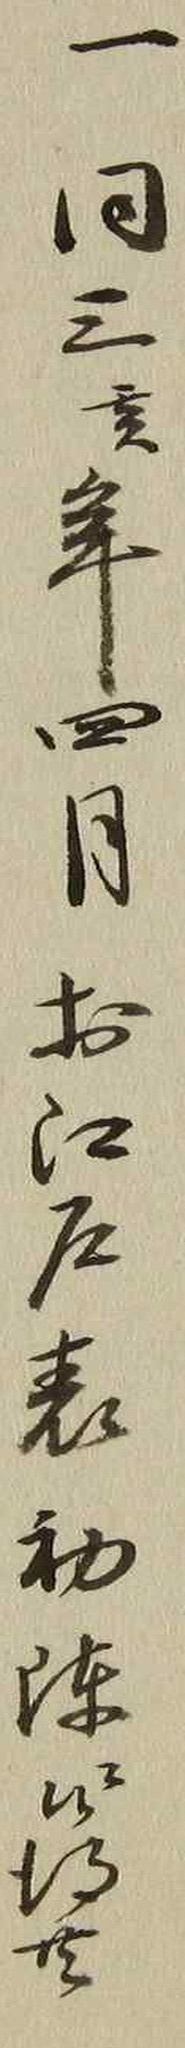一同三亥年四月於江戸表初陣ニ候得共
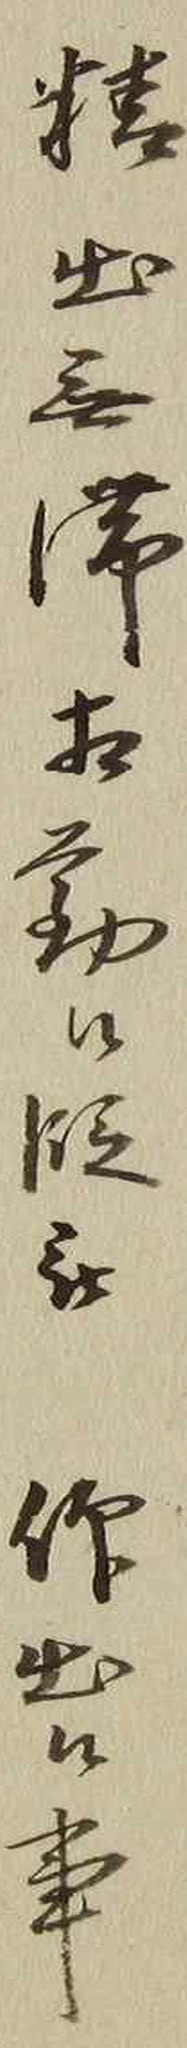精出無滞相勤候段被仰出候事
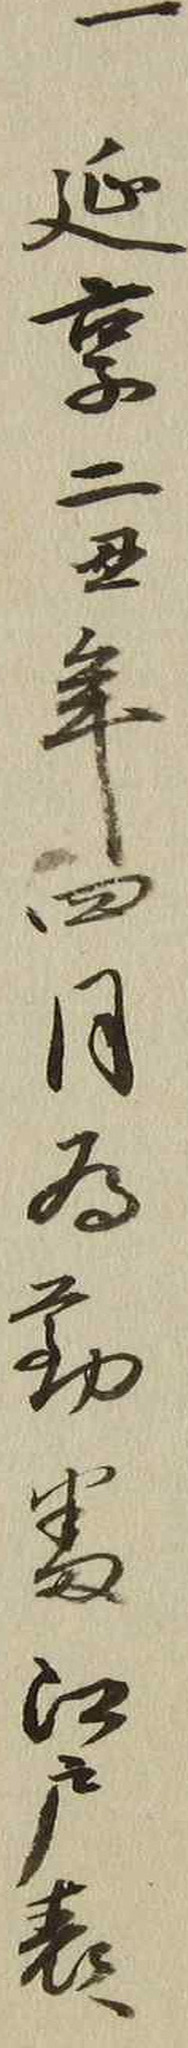一延享二丑年四月為勤番江戸表へ
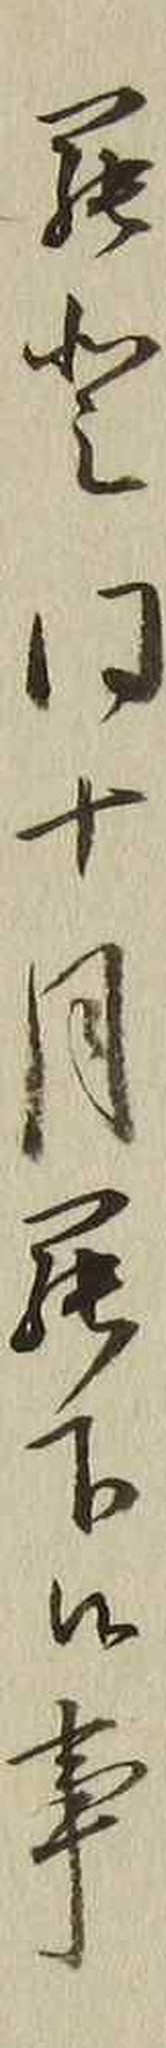罷登同十月罷下候事
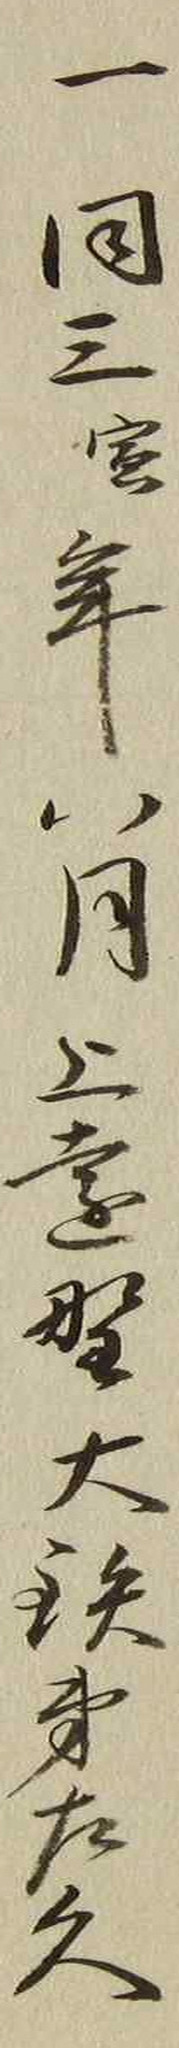一同三寅年八月上遠野大鉄弟左久
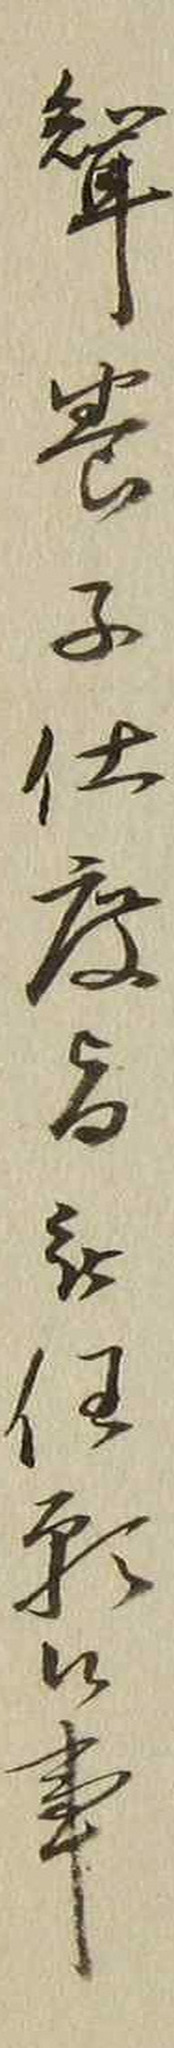婿養子仕度旨被任願候事
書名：諸士系譜　巻之128　た之部4
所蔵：会津若松市立会津図書館
